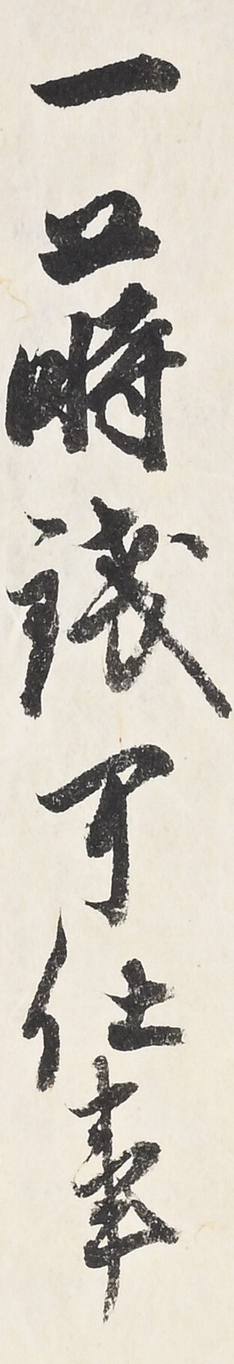一蒔銭可仕事
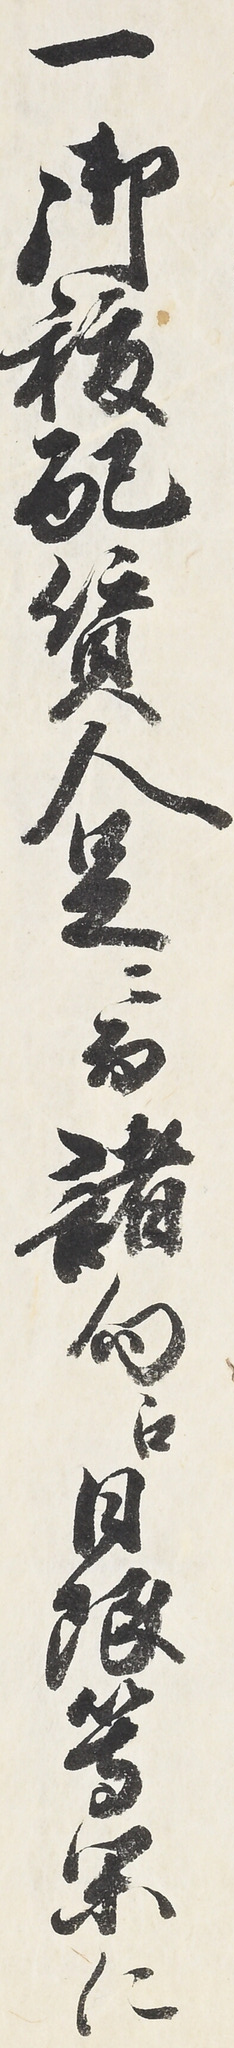一御祓配賃人足ニ而諸向江日限等閑に
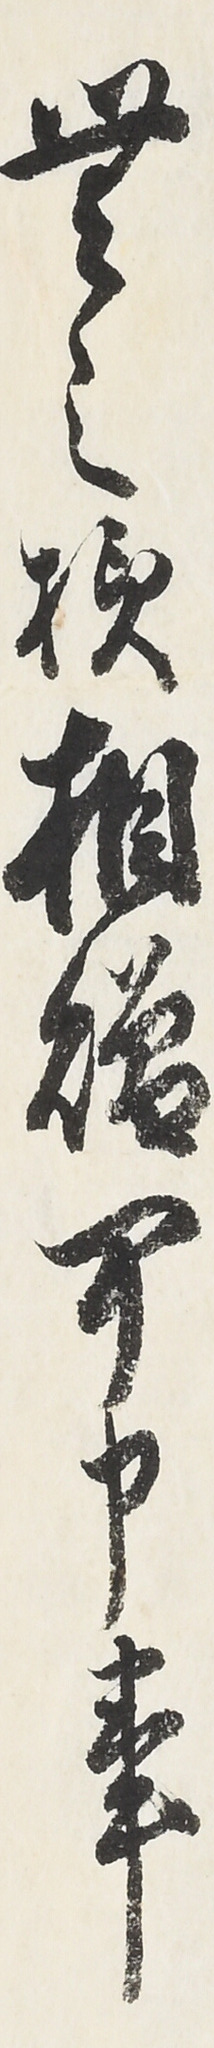無之様相贈可申事
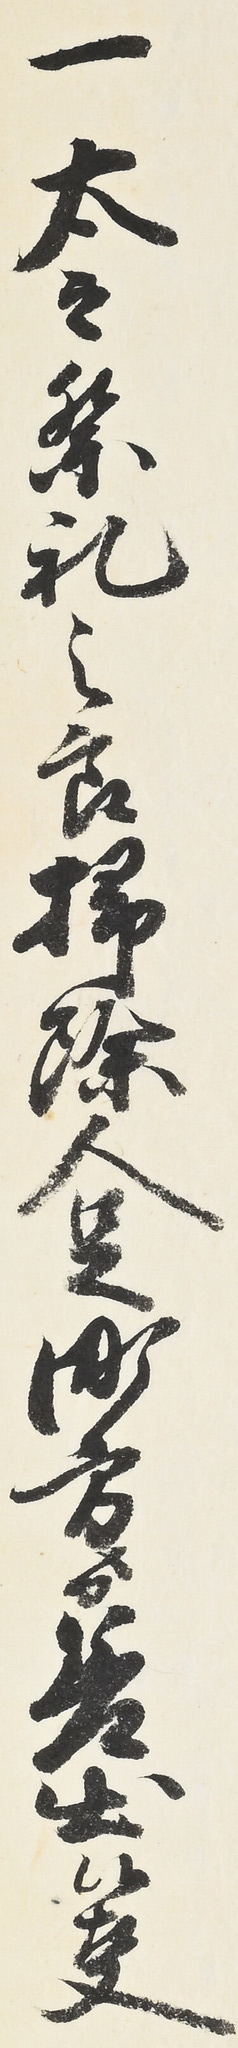一太々祭礼之節掃除人足町方ゟ差出候事
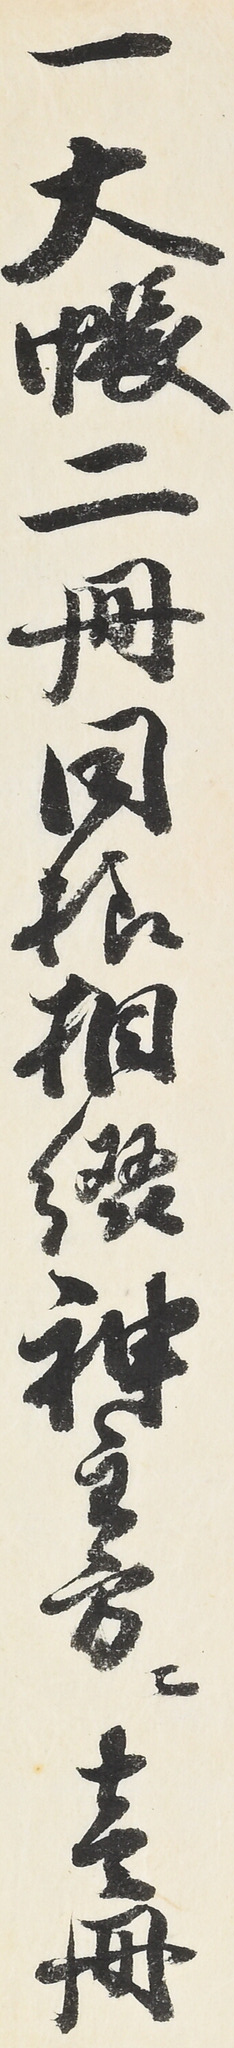一大帳二冊同様相綴神主方ニ壱冊
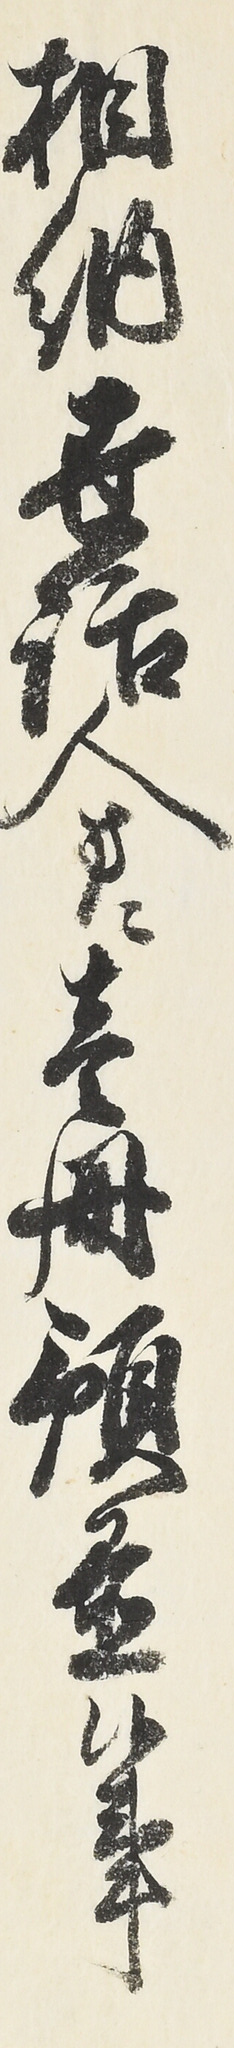相納世話人方ニ壱冊願置候事
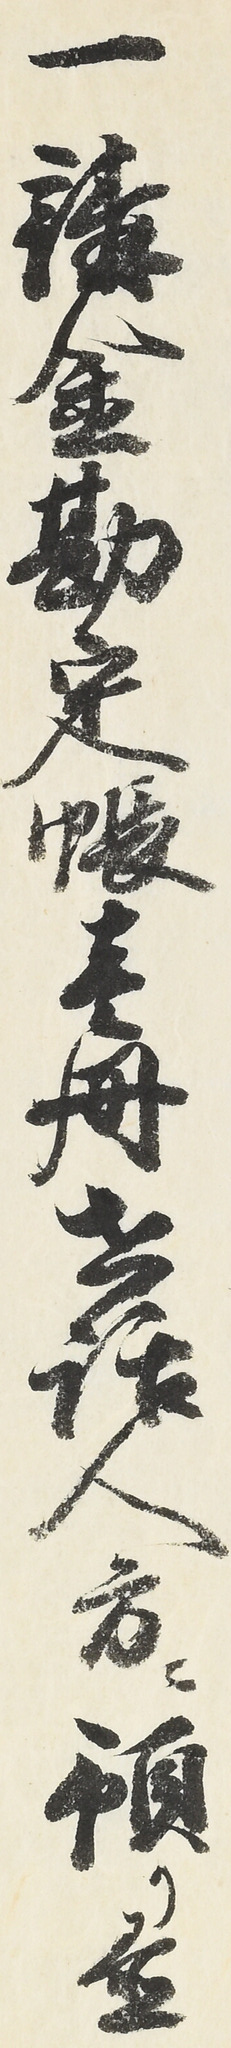一講金勘定帳壱冊世話人方ニ預り置
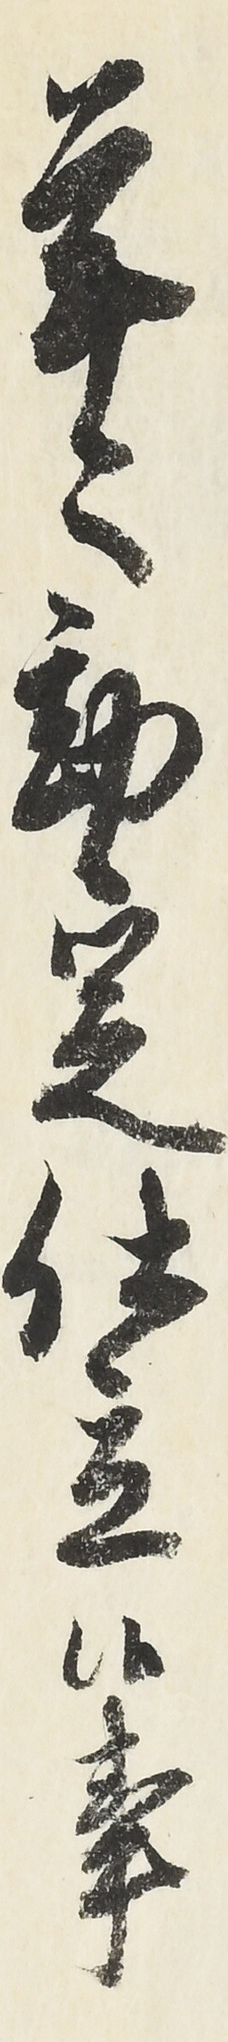年々勘定仕立候事
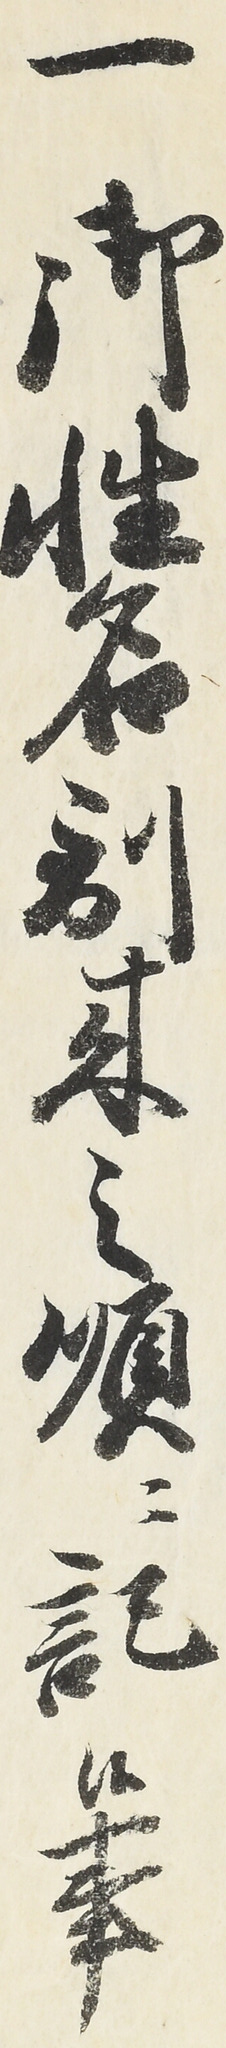一御姓名到来之順ニ記候事

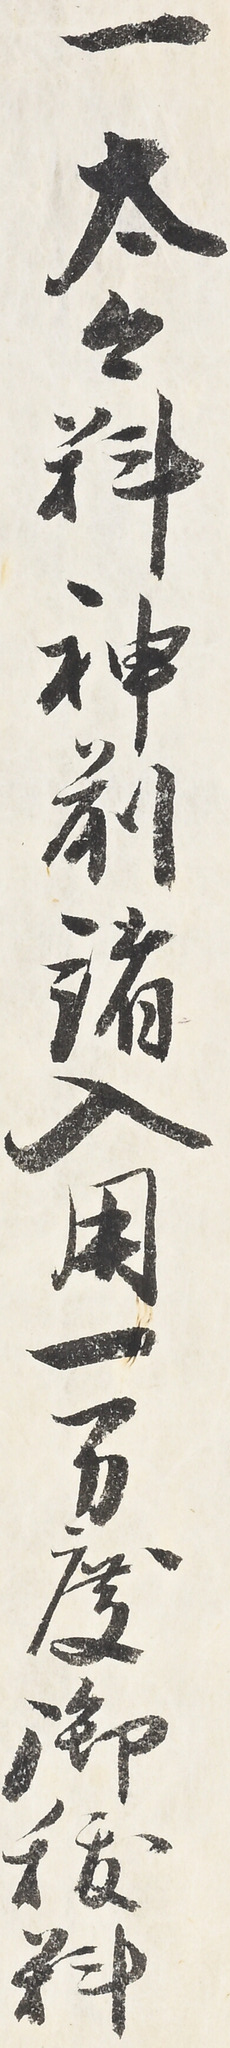一太々料神前諸入用一万度御祓料
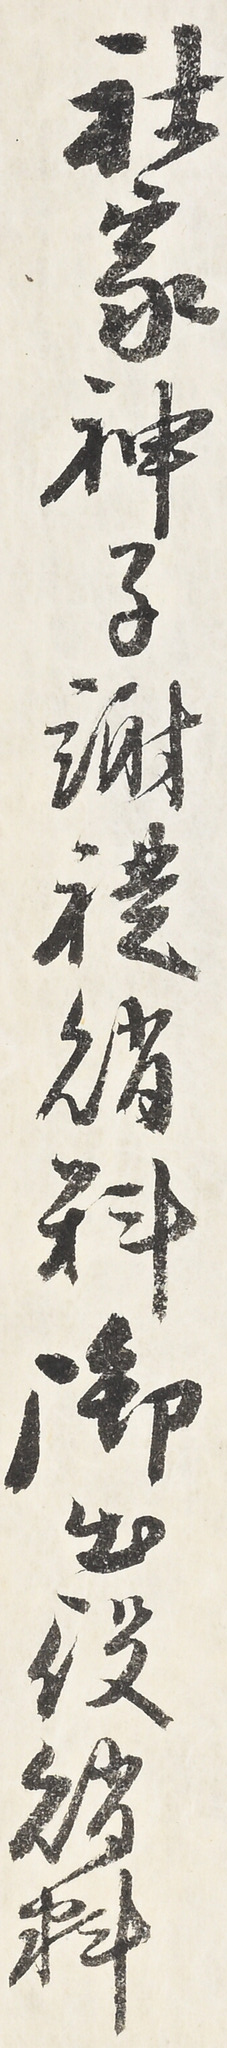社家神子謝礼賄料御出役賄料
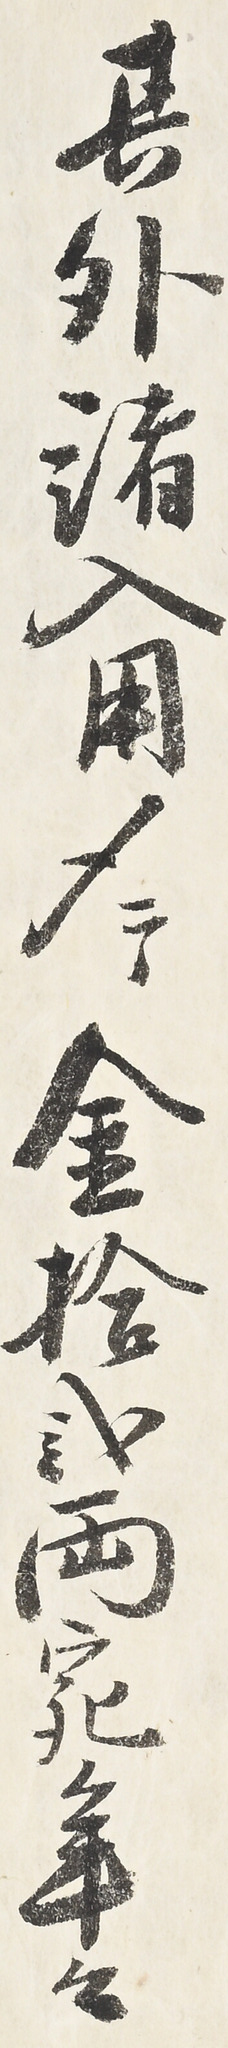甚外諸入用〆テ金拾弐両宛年々
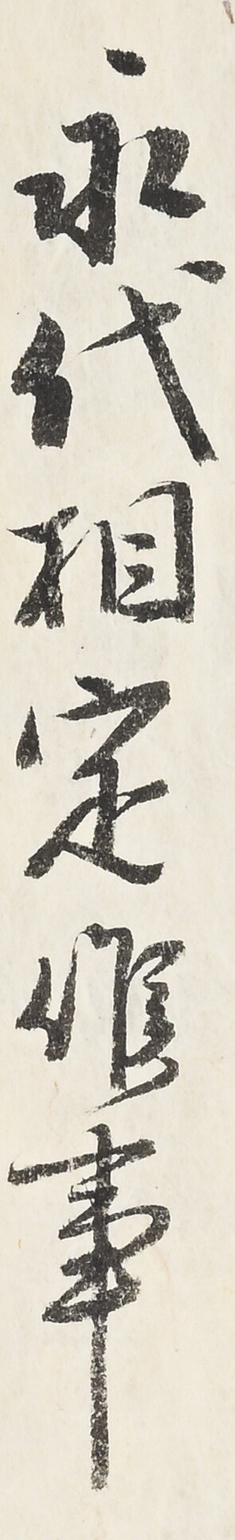永代相定候事
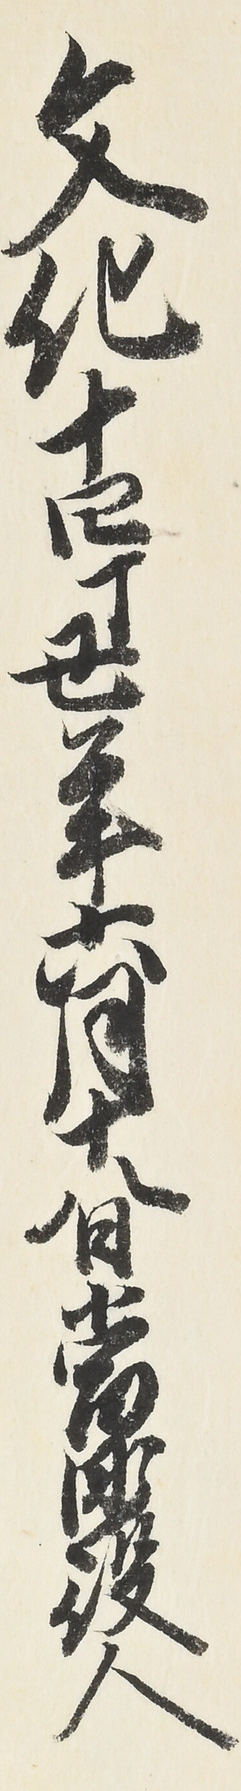文化十四丁丑年六月十八日当町役人
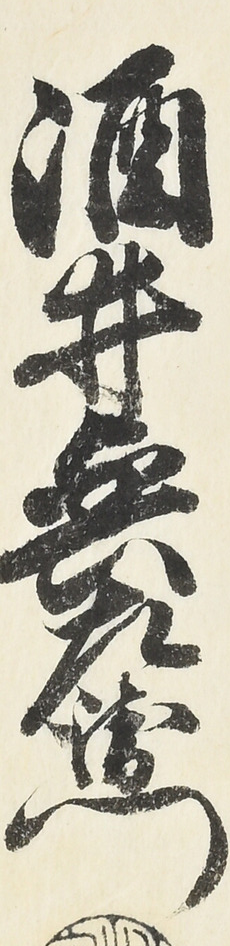酒井兵左衛門㊞
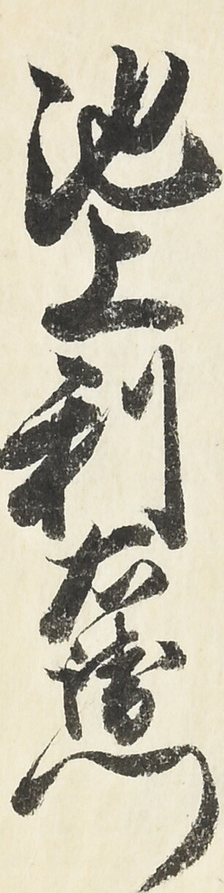池上利右衛門㊞
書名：永代太々御神楽名前帳
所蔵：伊那市立高遠町図書館・合同会社AMANE
